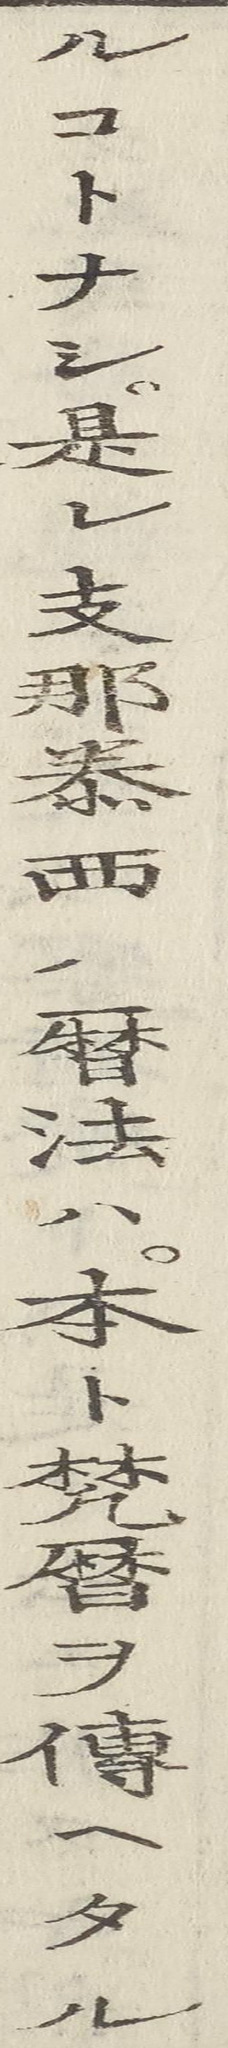ルコトナシ。是レ支那泰西ノ暦法ハ。本ト梵暦ヲ伝ヘタル

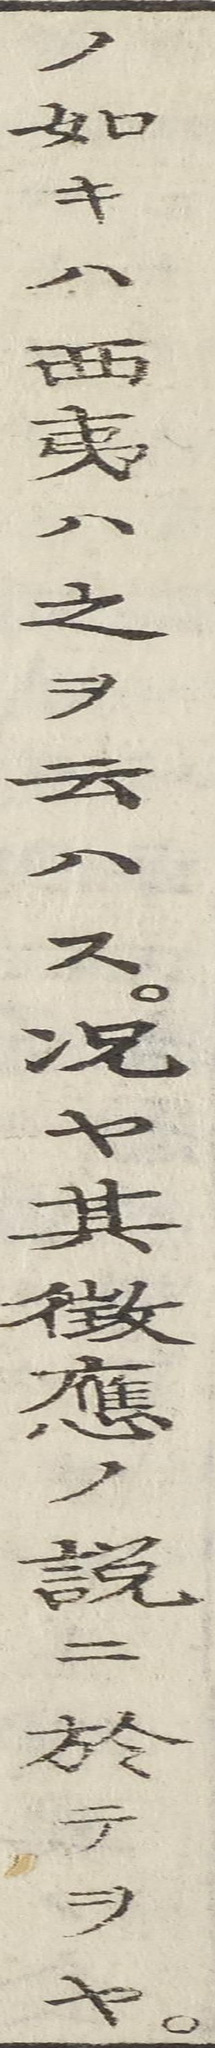ノ如キハ西夷ハ之ヲ云ハス。況ヤ其徴応ノ説ニ於テヲヤ。
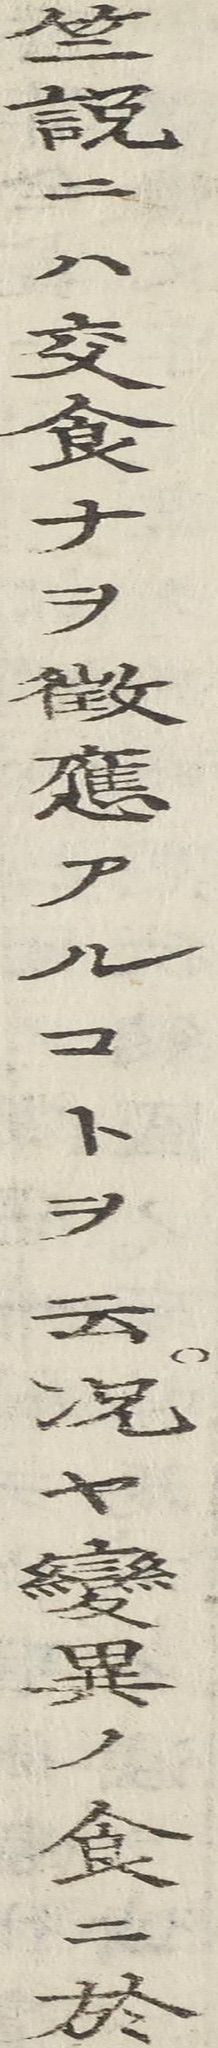竺説ニハ交食ナヲ徴応アルコトヲ云。況ヤ変異ノ食ニ於
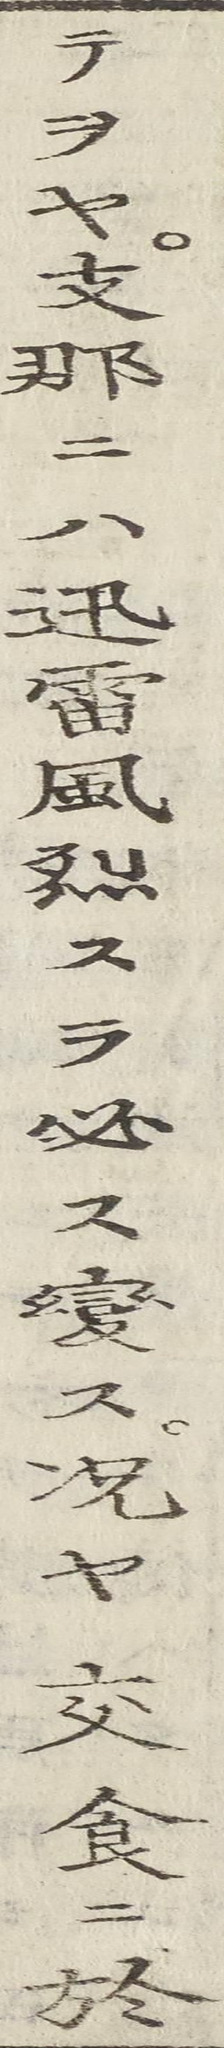テヲヤ。支那ニハ迅雷風烈スラ必ス変ス。況ヤ交食ニ於
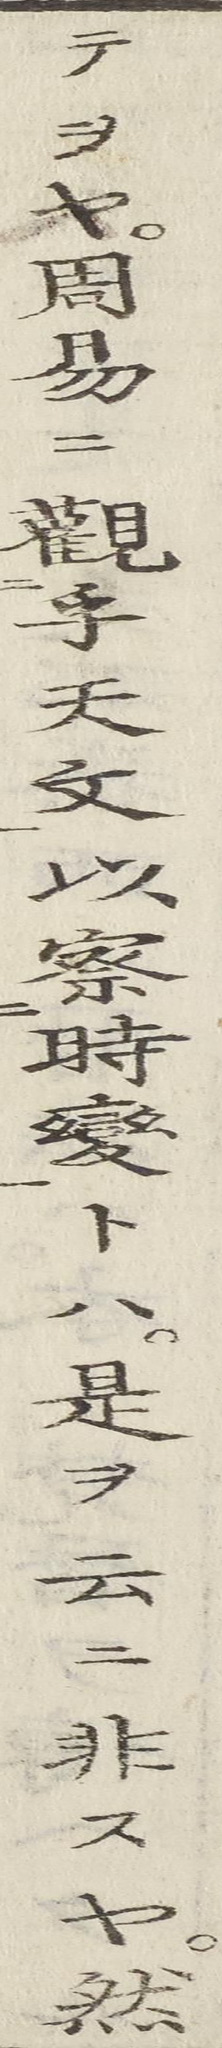テヲヤ。周易ニ観ニ乎天文以察ニ時変トハ。是ヲ云ニ非スヤ。然
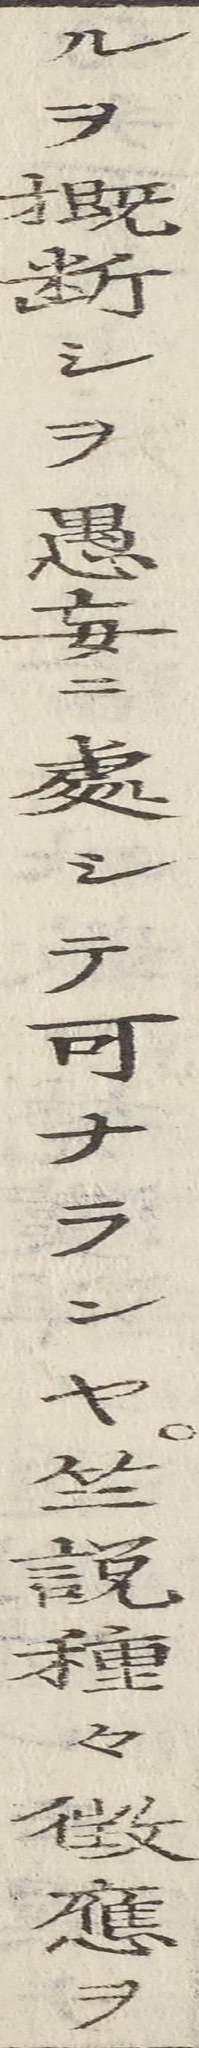ルヲ概断シヲ愚妄ニ処シテ可ナランヤ。竺説種々徴応ヲ
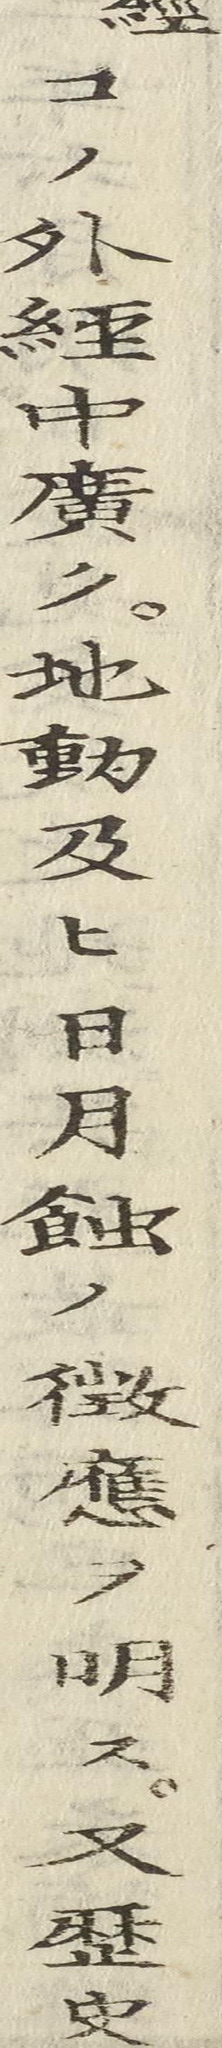経コノ外経中広ク。地動及ヒ日月蝕ノ徴応ヲ明ス。又歴史
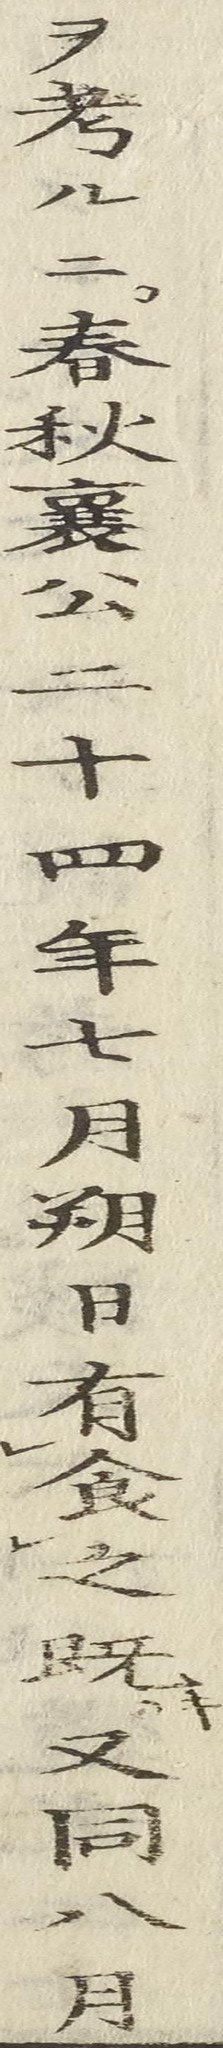ヲ考ルニ。春秋襄公二十四年七月朔日有食之既。又同八月
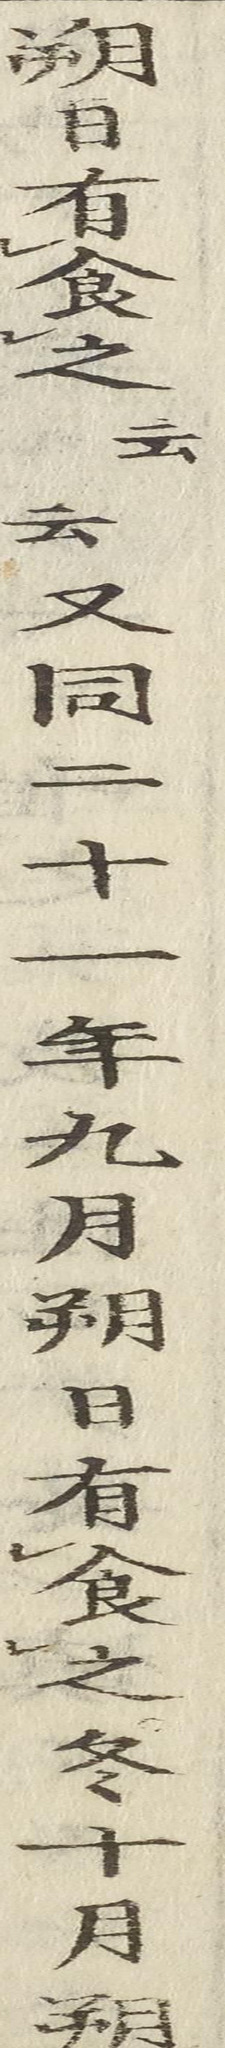朔日有食之云云又同二十一年九月朔日有食之冬十月朔
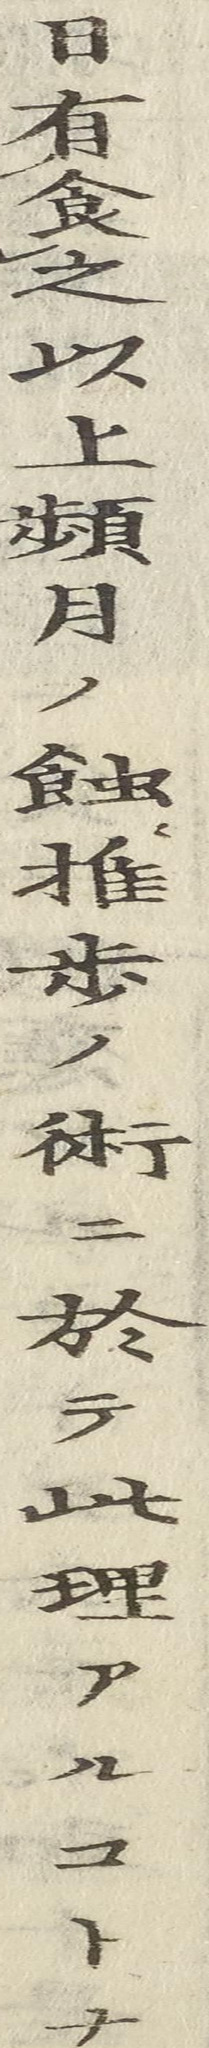日有食之以上頻月ノ蝕。推歩ノ術ニ於テ此理アルコトナ
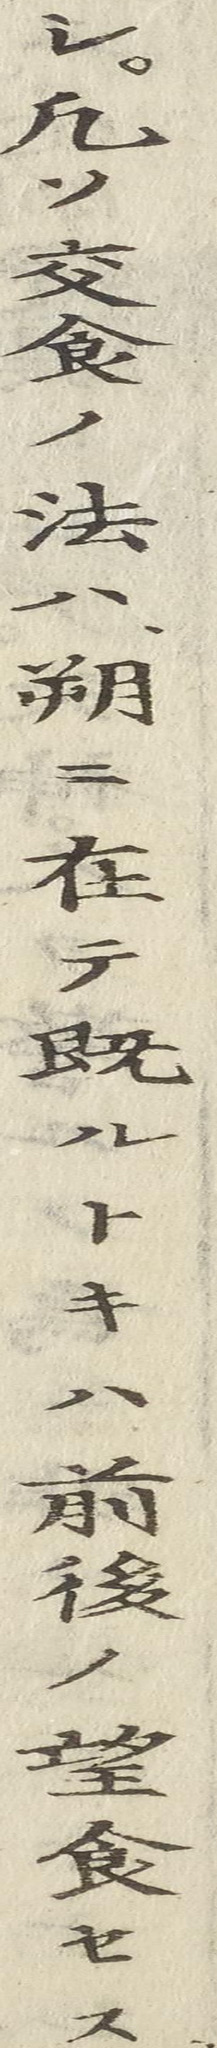シ。凡ソ交食ノ法ハ、朔ニ在テ既ルトキハ前後ノ望食セス。
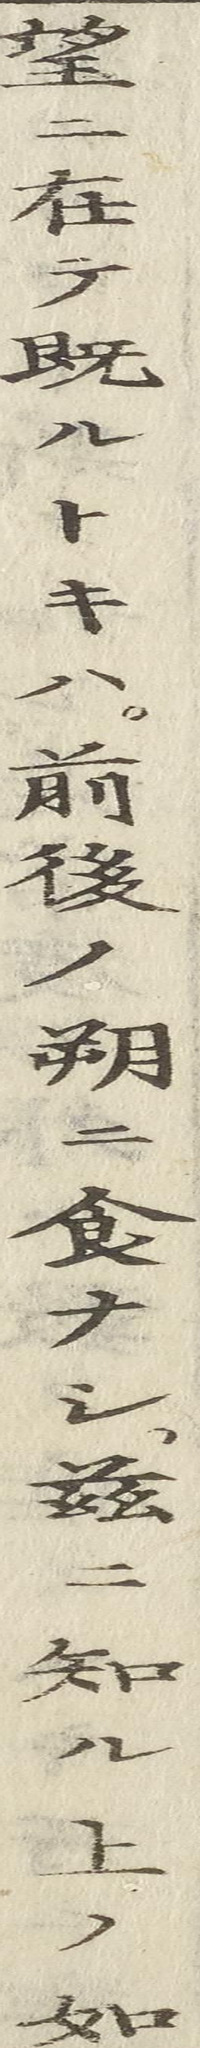望ニ在テ既ルトキハ。前後ノ朔ニ食ナシ。茲ニ知ル上ノ如
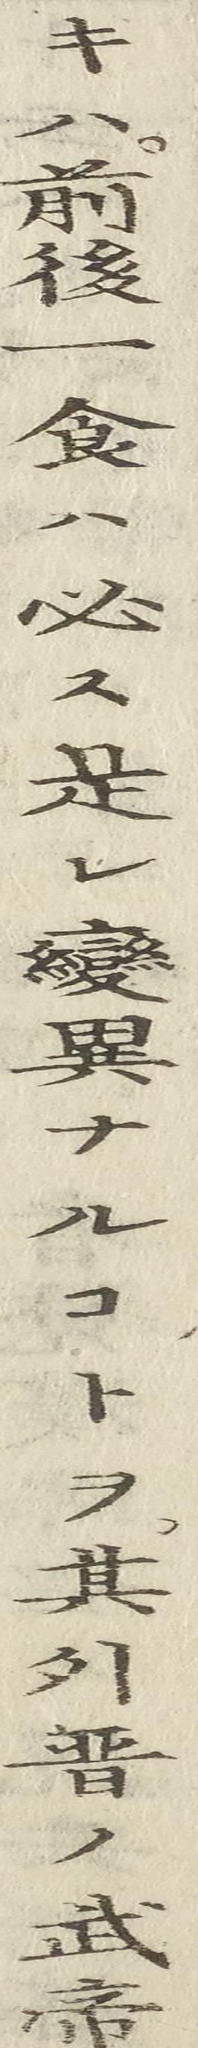キハ。前後一食ハ必ス是レ変異ナルコトヲ。其外晋ノ武帝
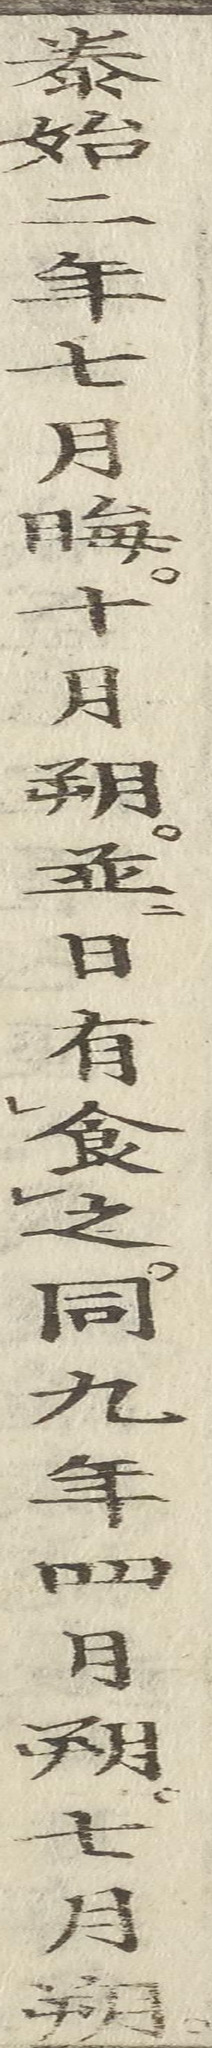桊始二年七月晦。十月朔。並日有食之。同九年四月朔。七月朔。
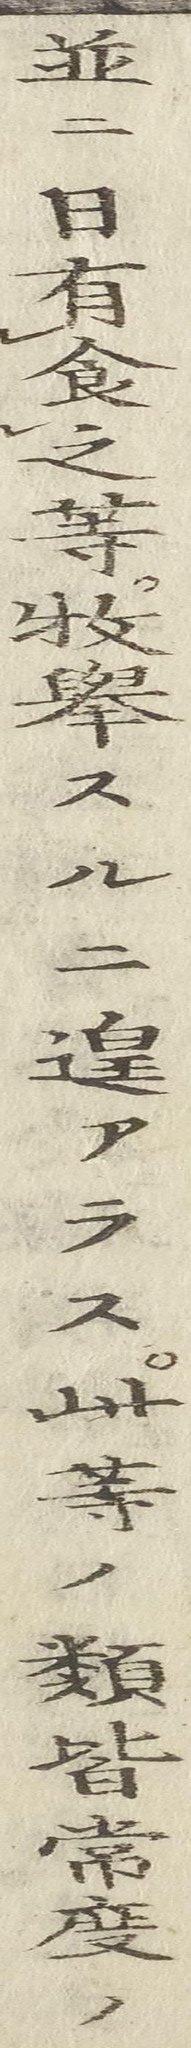並ニ日有食之等。枚挙スルニ遑アラス。此等ノ類皆常度ノ
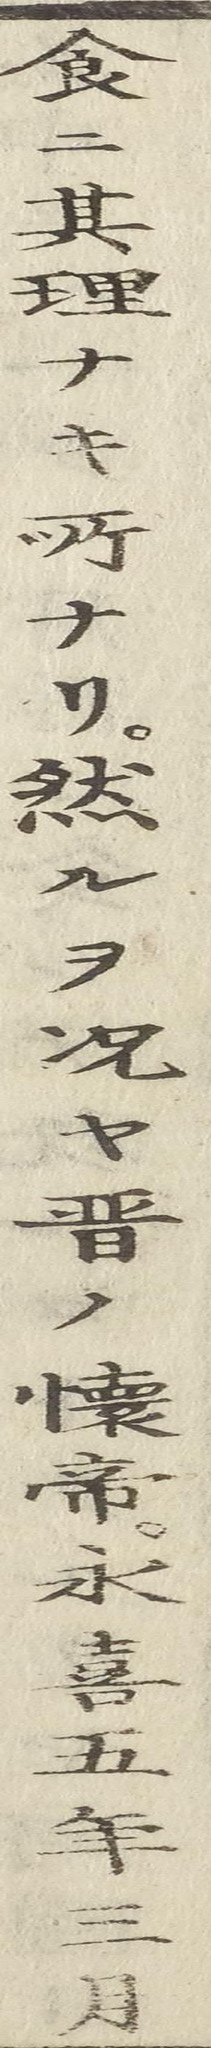食ニ其理ナキ所ナリ。然ルヲ況ヤ晋ノ懐帝。永喜五年三月
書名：護法新論　二編　下
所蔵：東京大学地震研究所図書室 Earthquake Research Institute Library, The University of Tokyo, JAPAN
